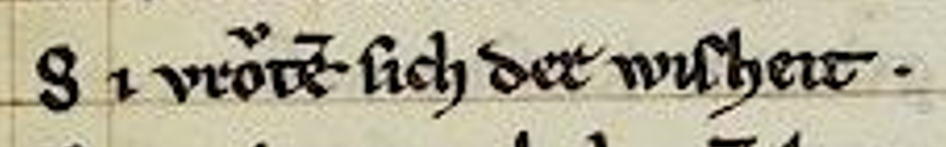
Si vro°vte(n) ſich der wiſheit.
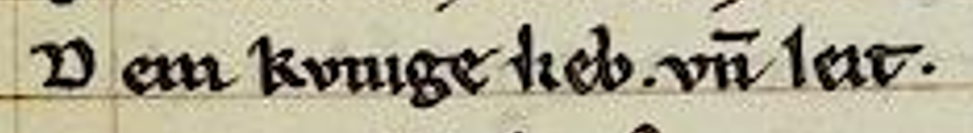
Dem kvnige lieb. vn(d) leit.
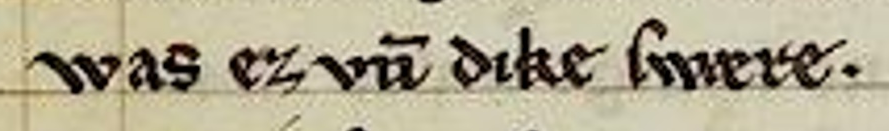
Was ez vn(d) dike ſw[ae]re.
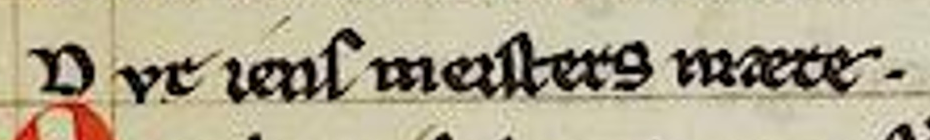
Dvr ienſ meiſters m[ae]re.
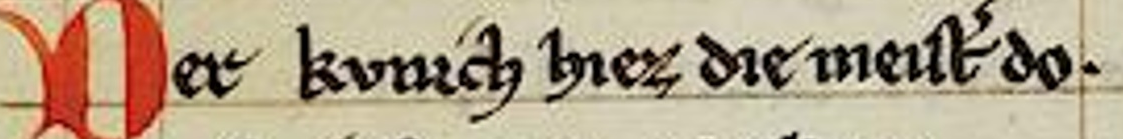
*Der kvnich hiez die meiſt(er) do.
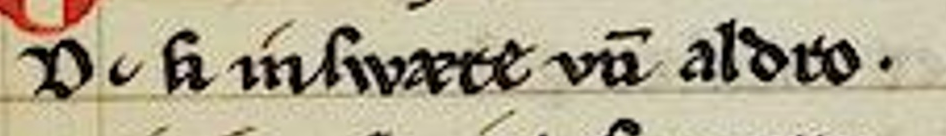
D(az) ſi in ſw[ae]re vn(d) aldro.
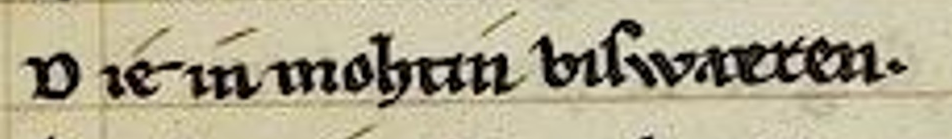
Die in mohtin biſw[ae]ren.
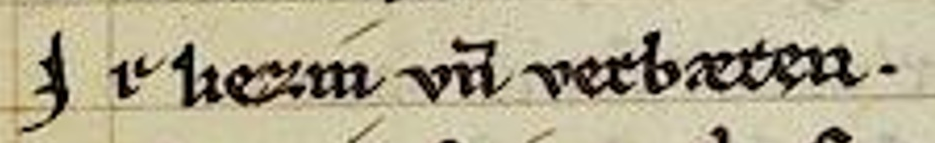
Ir liezin vn(d) verb[ae]ren.
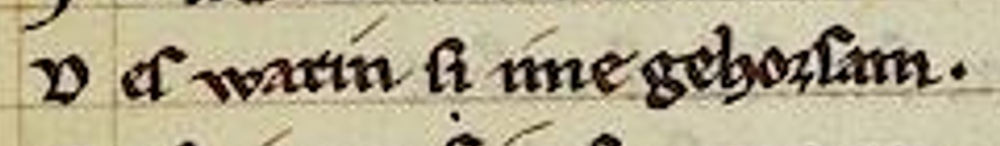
Deſ warin ſi ime gehorſam.
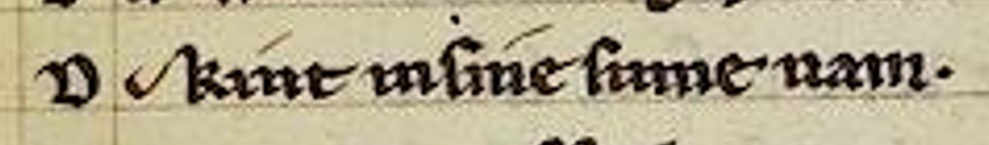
D(az) kint inſine ſinne nam.
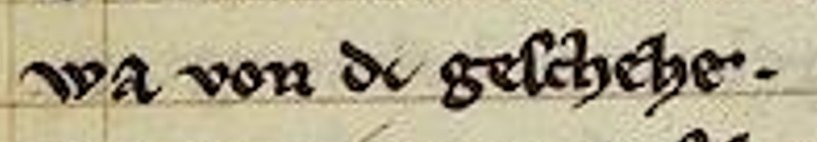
Wa von d(az) geſchehe.
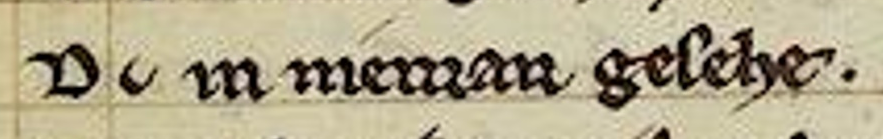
D(az) in nieman geſehe.
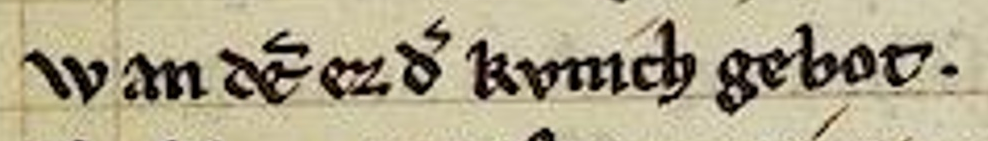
Wan de(n) ez d(er) kvnich gebot.
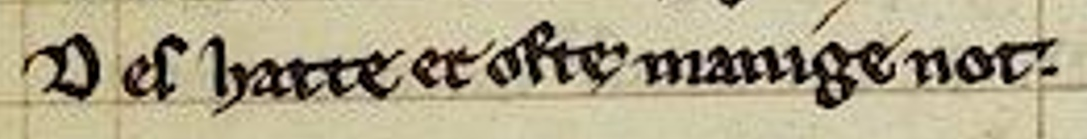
Deſ hatte er ofte manige not.
